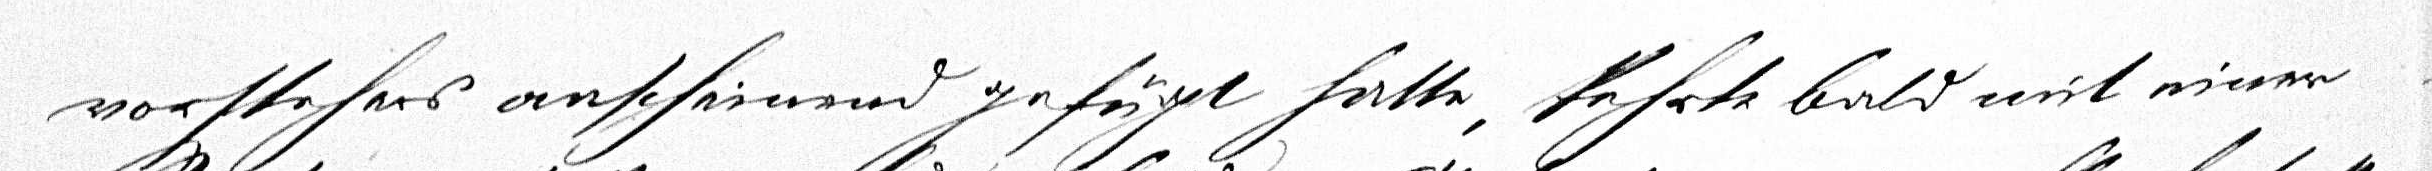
vorstehers anscheinend gefugt hatte, kehrte bald mit einer
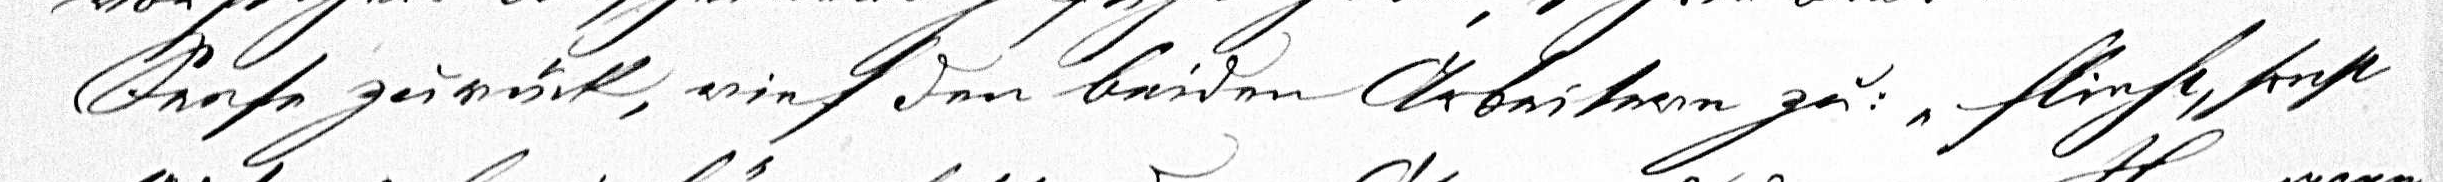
Sense zurück, rief den beiden Arbeitern zu: „flieht, sonst
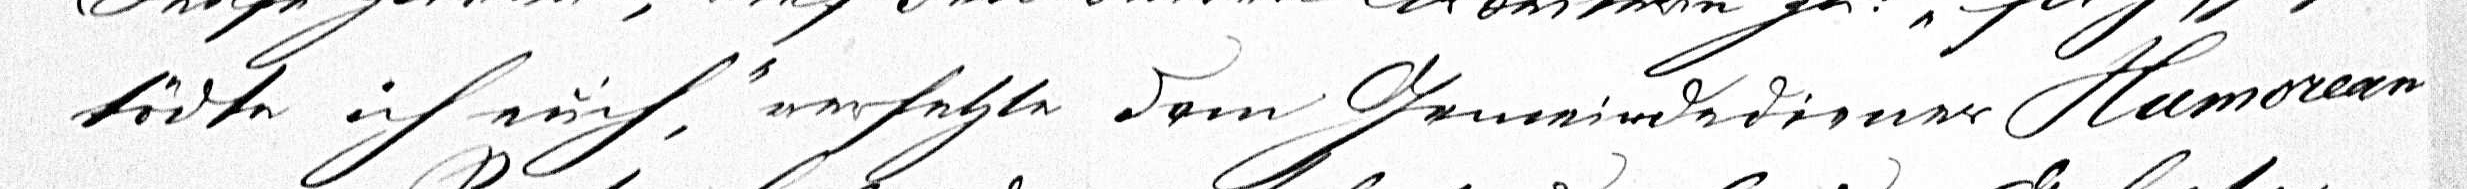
tödte ich auch“, versetzte dem Gemeindediener Humorean
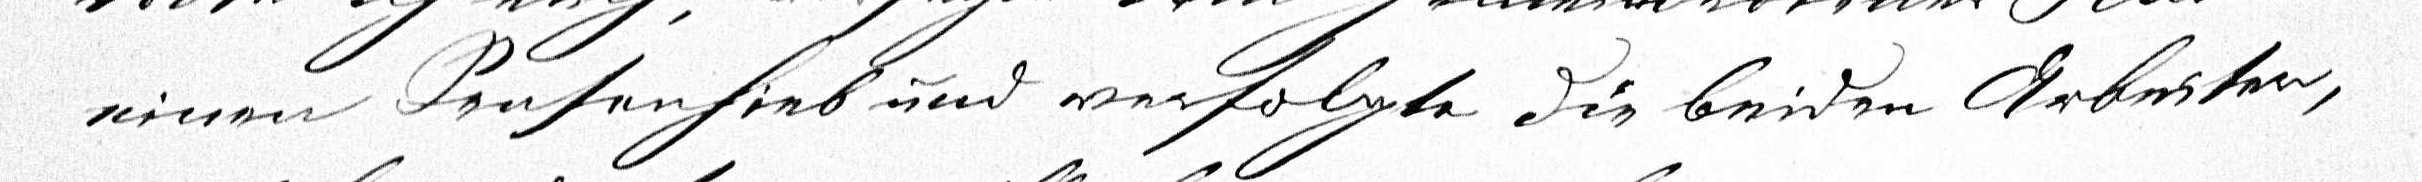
einen Sensenhieb und verfolgte die beiden Arbeiten,
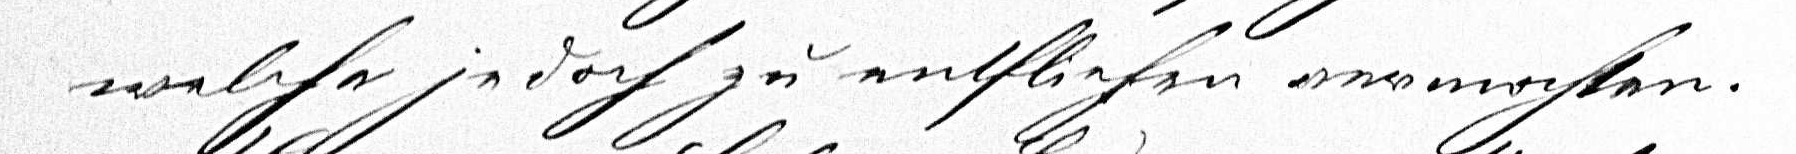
welche jedoch zu entfliehen vermochten.
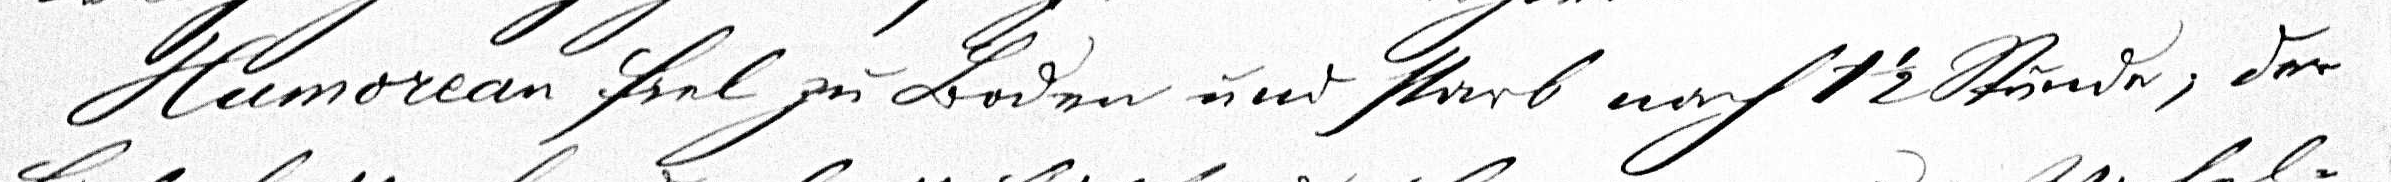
Humorean Fiel zu Boden und starb nach 1 1/2 Stunde; der
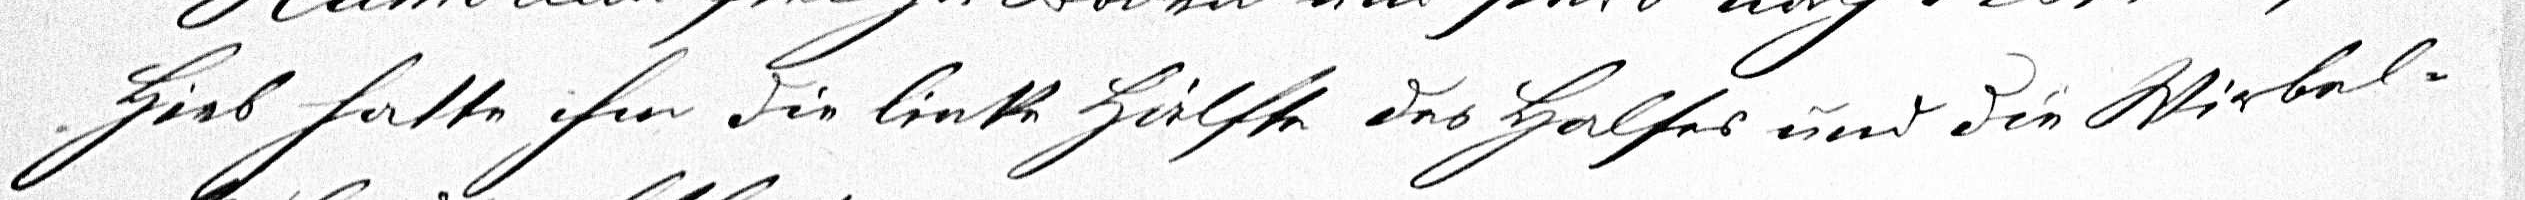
Hieb hatte ihm die linke Hälfte des Halfes und die Wirbel¬
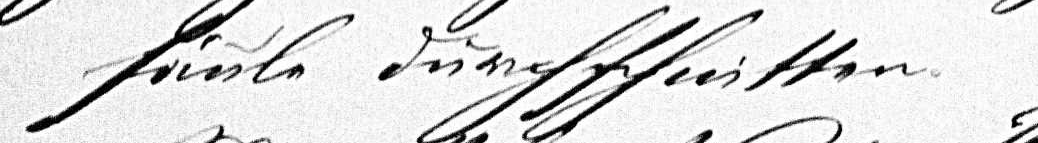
säule durchschnitten.
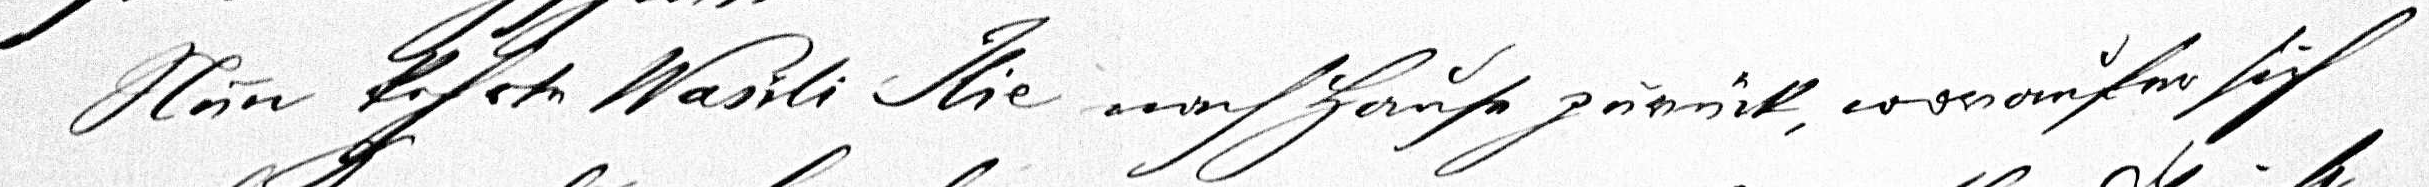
Nun kehrte Wasili Kie nach Hause zurück, woraufer sich
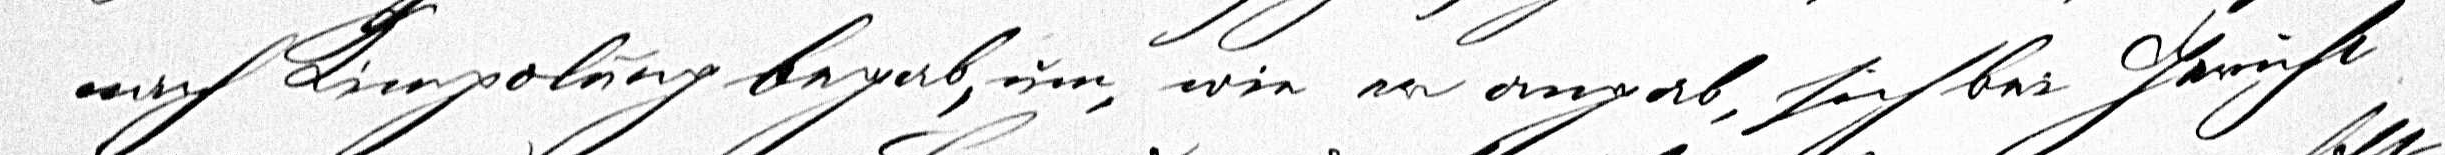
nach Kimpolung begab, um, wie er angab, sich bei Gericht
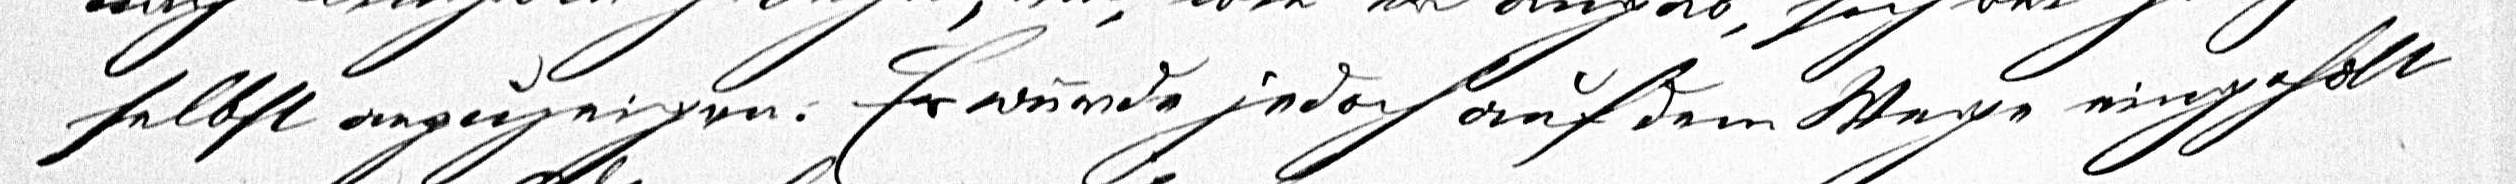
selbst anzuzeigen. Er wurde jedoch auf dem Wege eingeholt
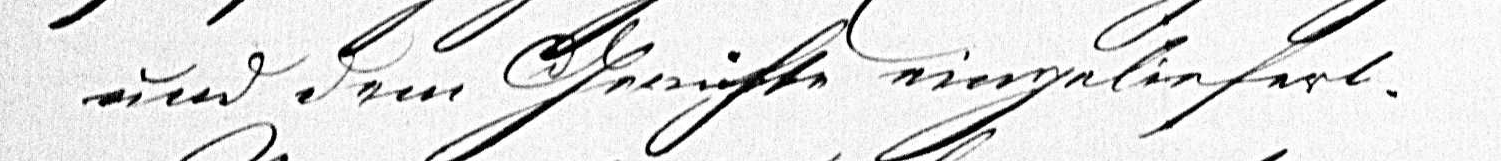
und dem Gerichte eingeliefert.
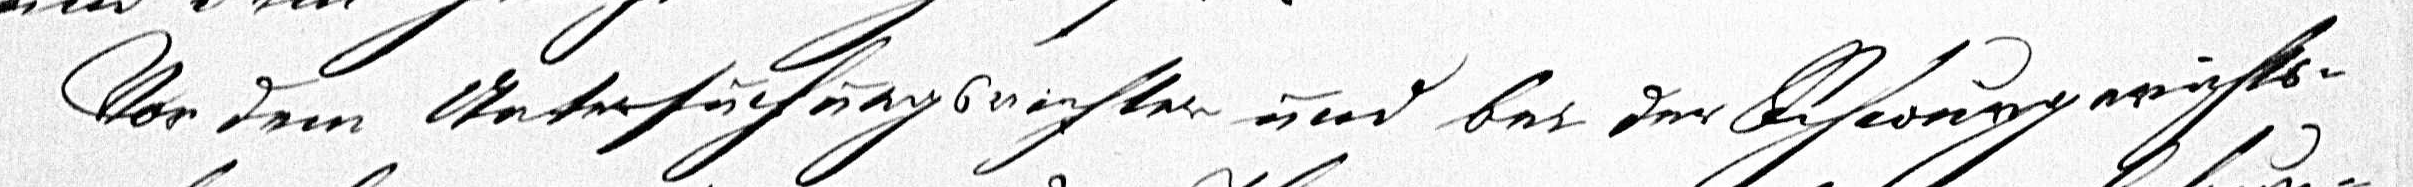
Vor dem Untersuchungsrichter und bei der Schwurgerichts¬
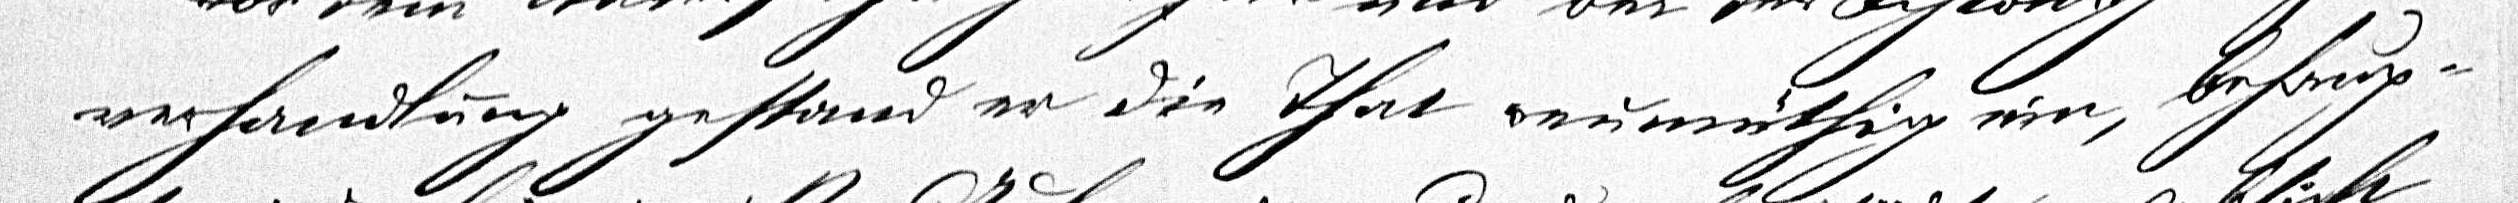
verhandlung gestand er die That reumüthig ein, behaup¬
